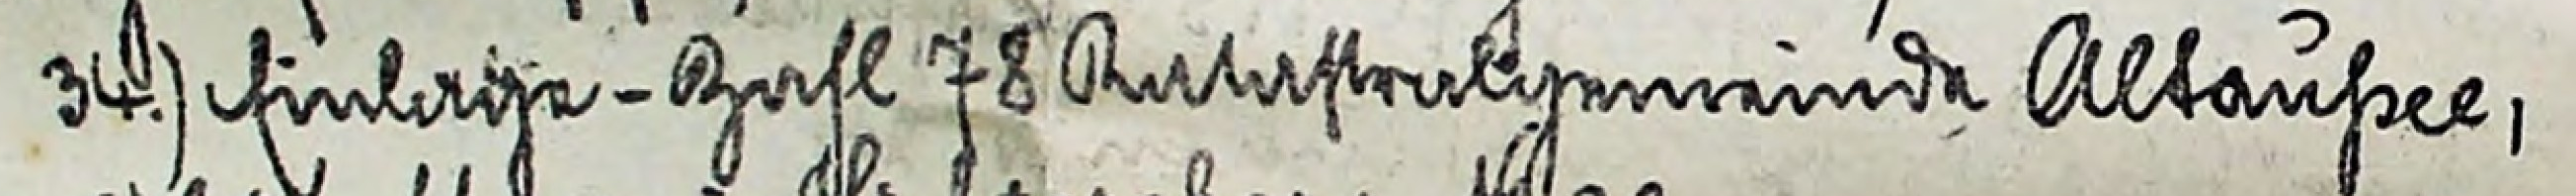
34.) Einlage - Zahl 78 Katastralgemeinde Altaussee,
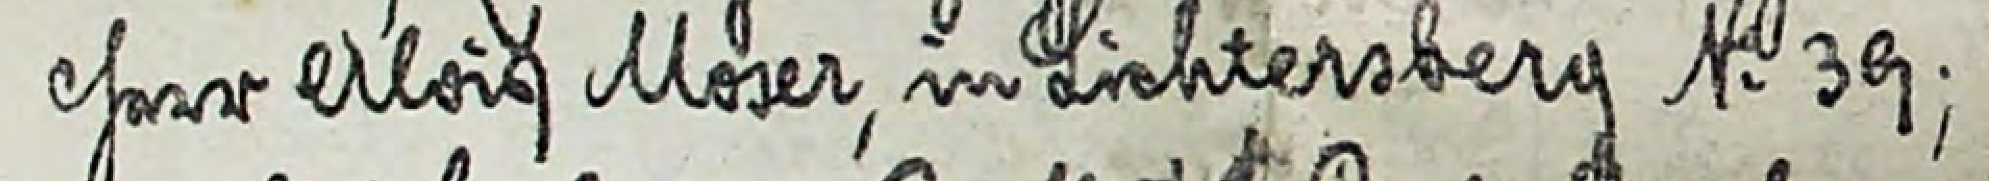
Herr Alois Moser, in Lichtersberg No 39;
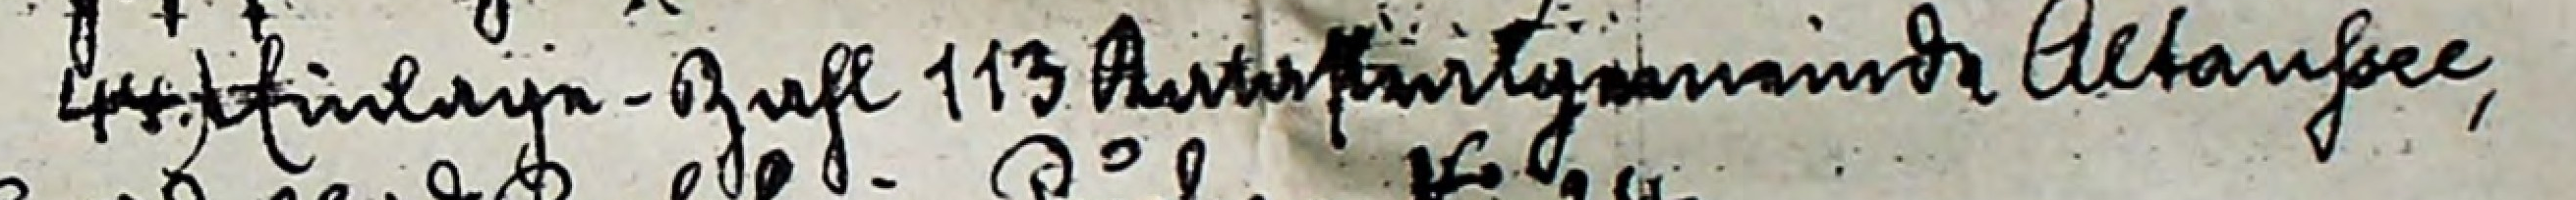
44.) Einlage - Zahl 113 Katastralgemeinde Altaussee,
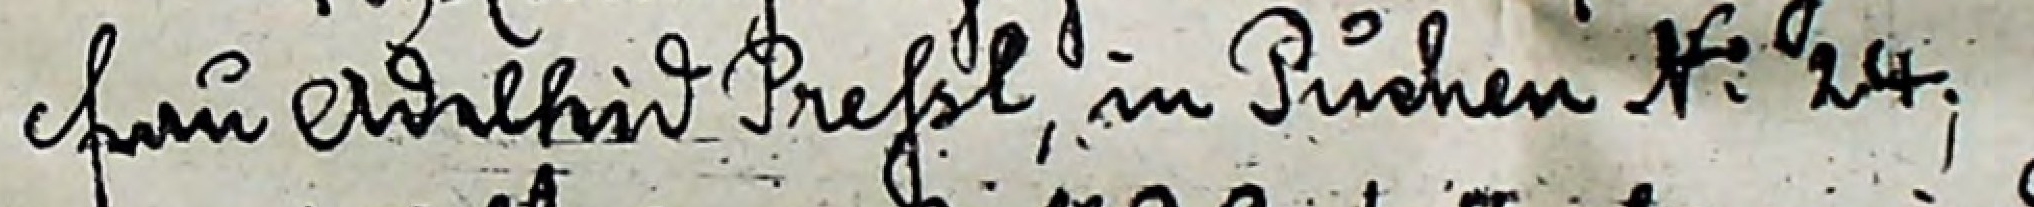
Frau Adelheid Pressl, in Puchen No 24;
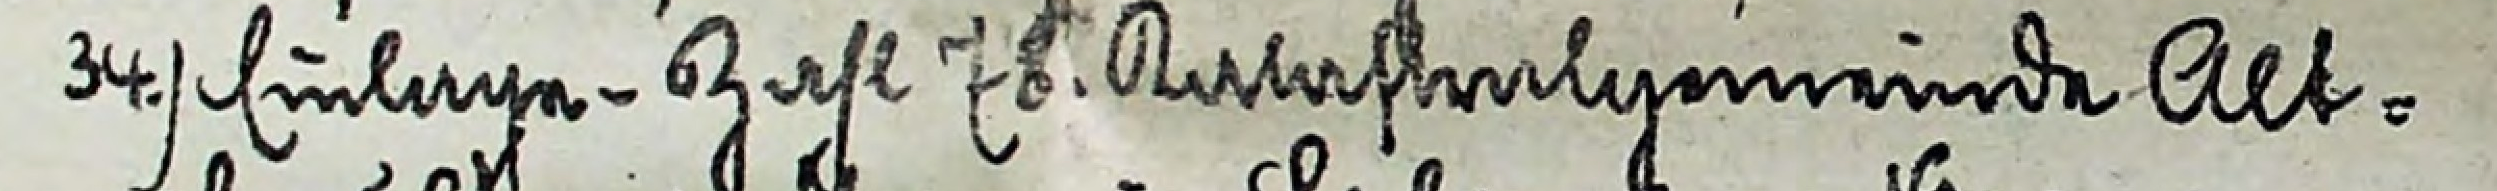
34.) Einlage - Zahl 78. Katastralgemeinde Alt=
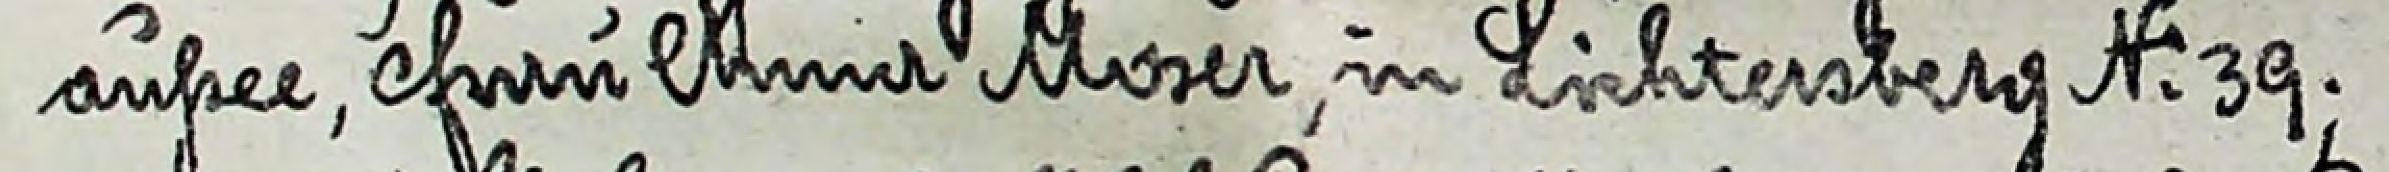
aussee, Frau Anna Moser, in Lichtersberg No 39;
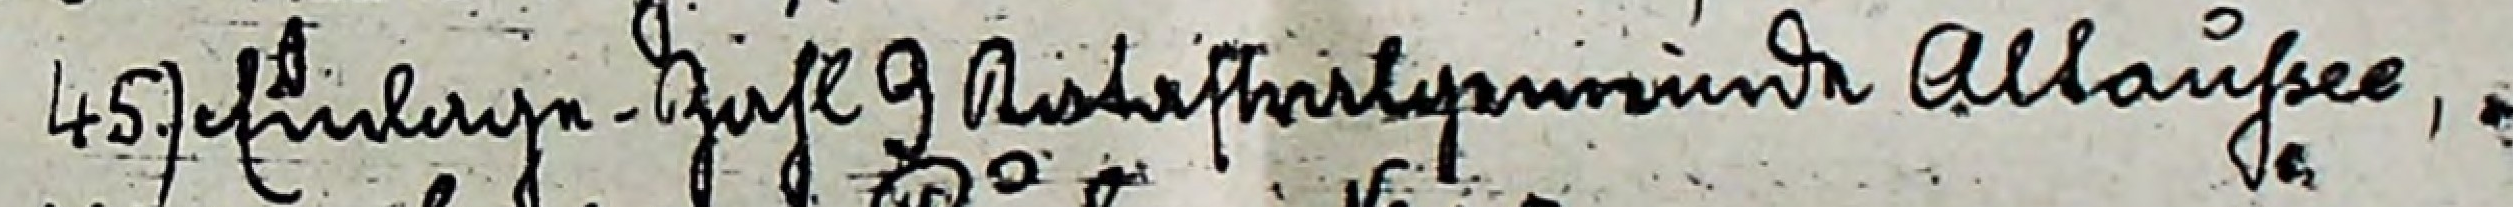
45.) Einlage - Zahl 9 Katastralgemeinde Altaussee,
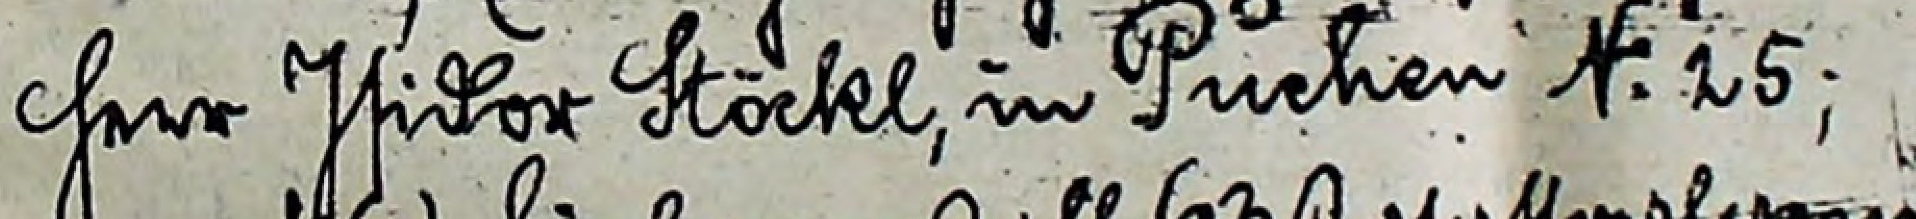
Herr Isidor Stöckl, in Puchen No 25;
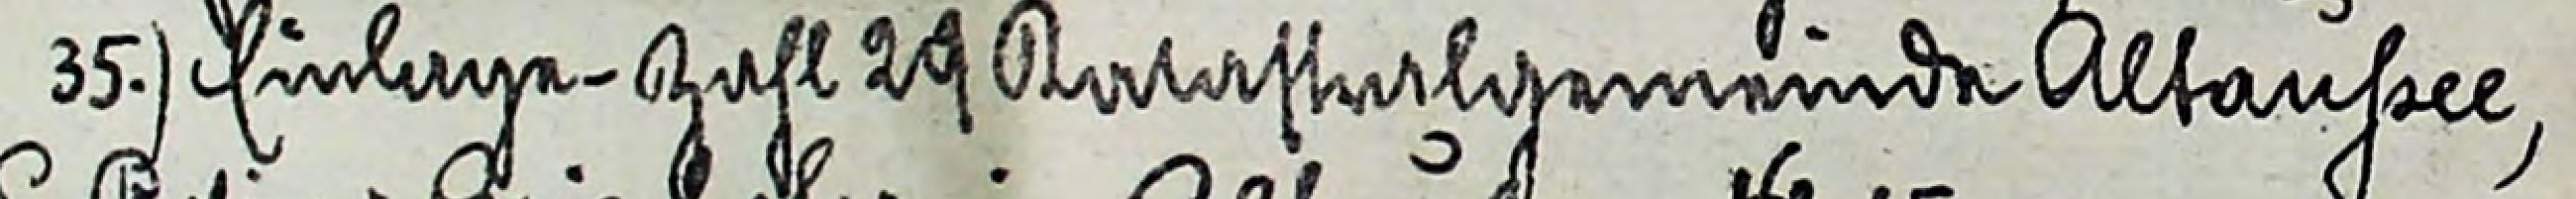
35.) Einlage - Zahl 29 Katastralgemeinde Altaussee,
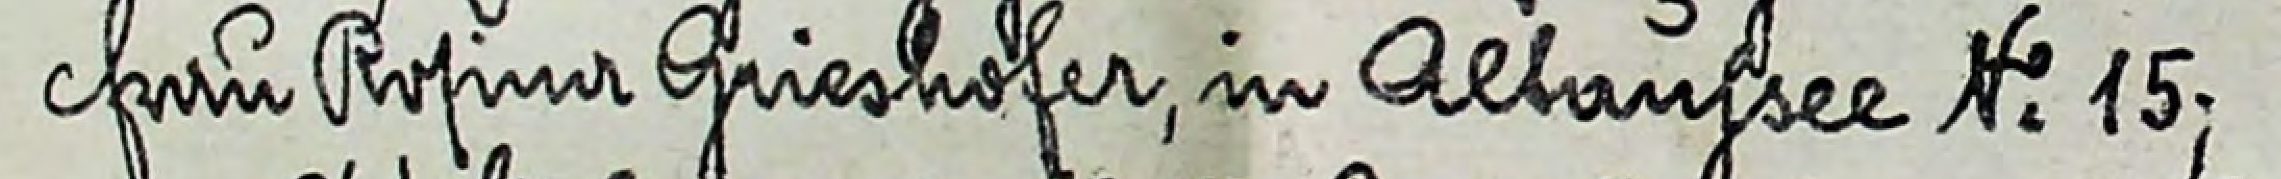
Frau Rosina Grieshofer, in Altaussee No 15;
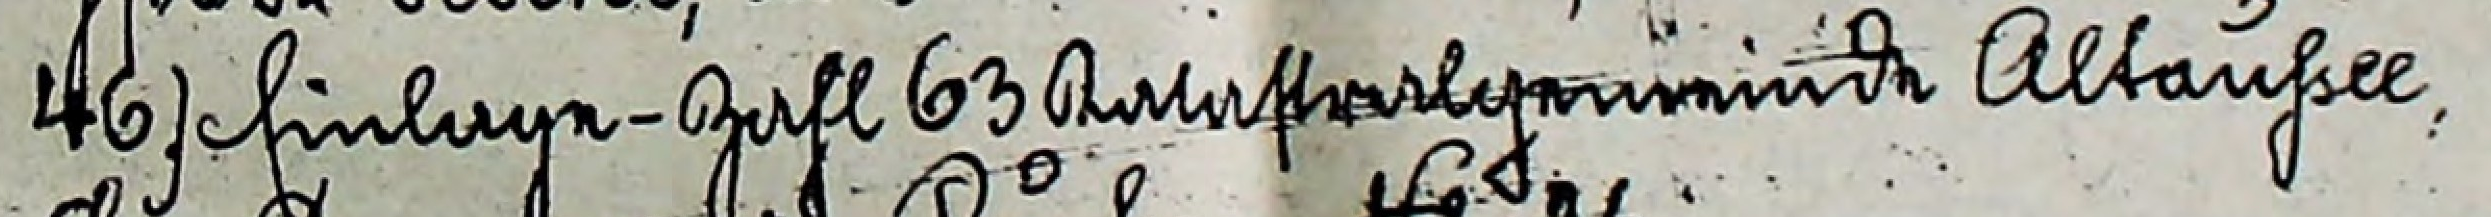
46.) Einlage - Zahl 63 Katastralgemeinde Altaussee,
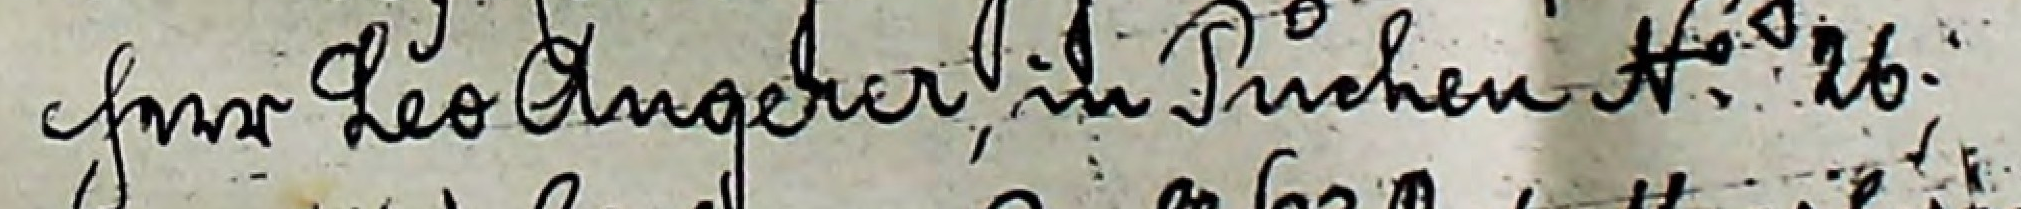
Herr Leo Angerer, in Puchen No 26;
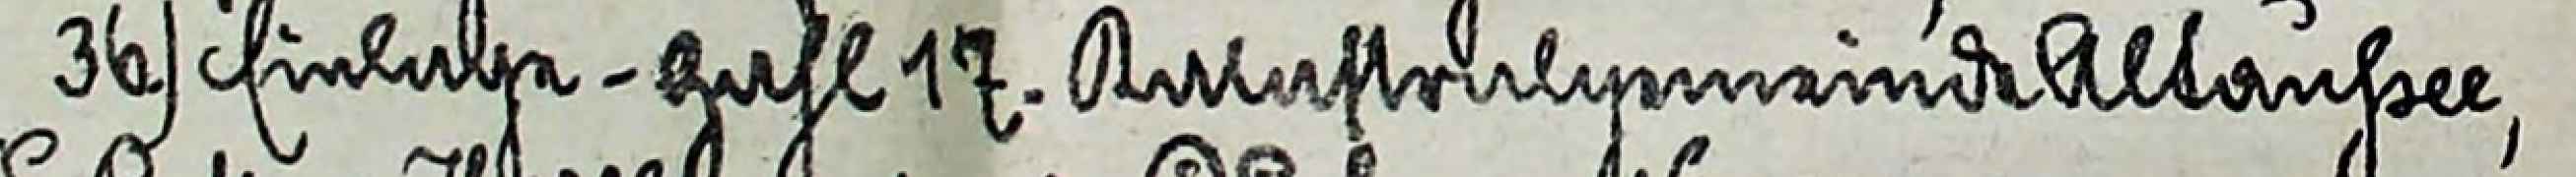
36.) Einlage - Zahl 17. Katastralgemeinde Altaussee,
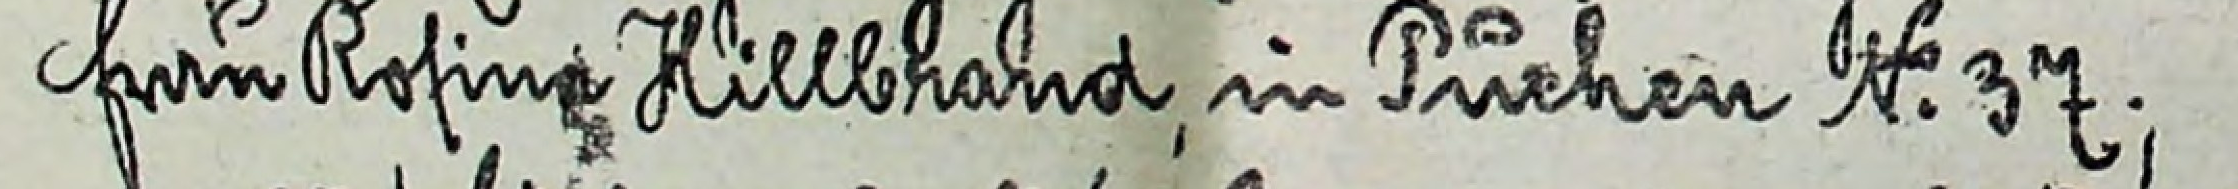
Frau Rosina Hillbrand, in Puchen No 37;
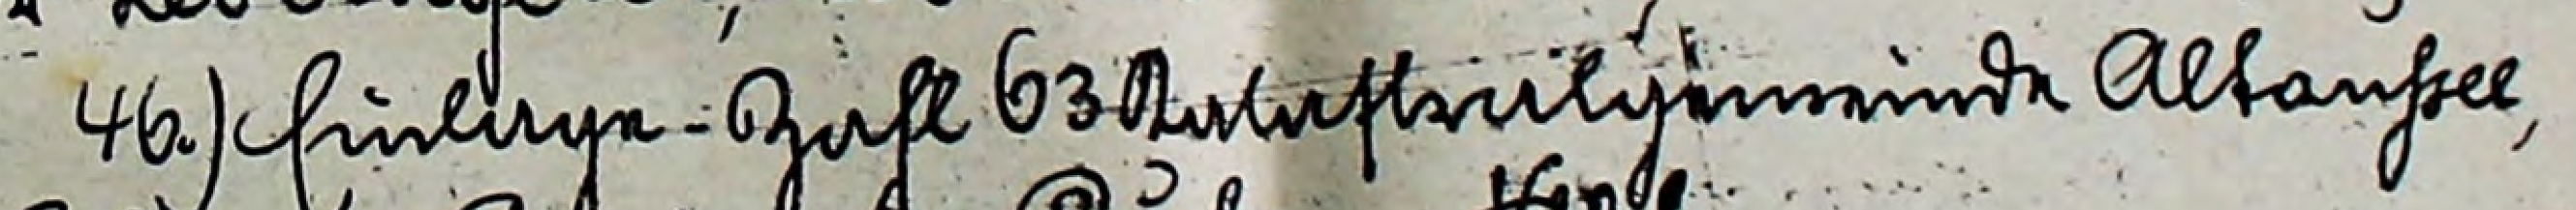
46.) Einlage - Zahl 63 Katastralgemeinde Altaussee,
